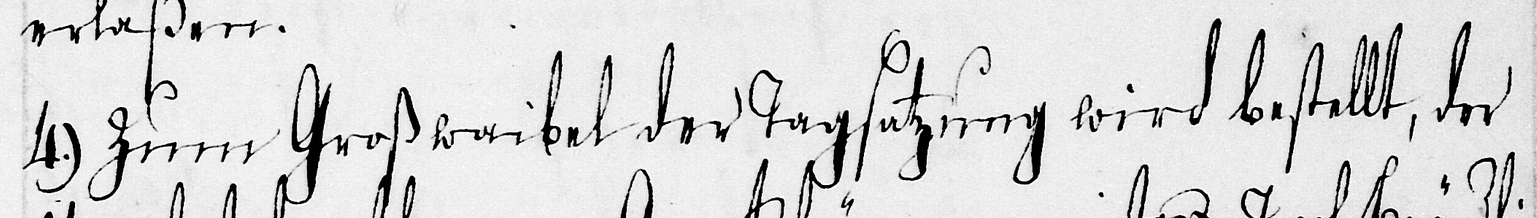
4.) Zum Großwaibel der Tagsatzung wird bestellt, der
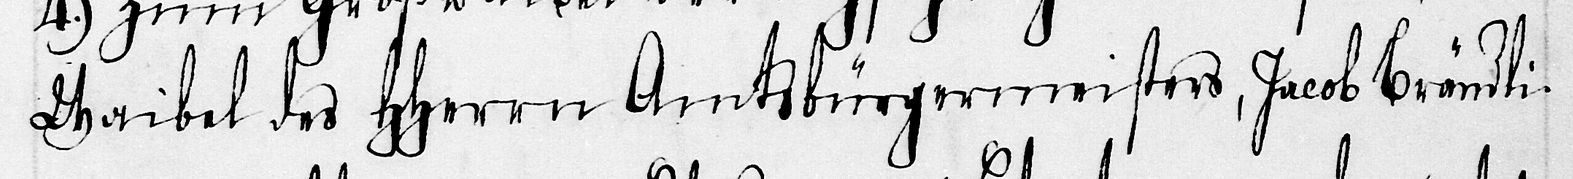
Waibel des HHerrn Amtsbürgermeisters, Jacob Brändli.
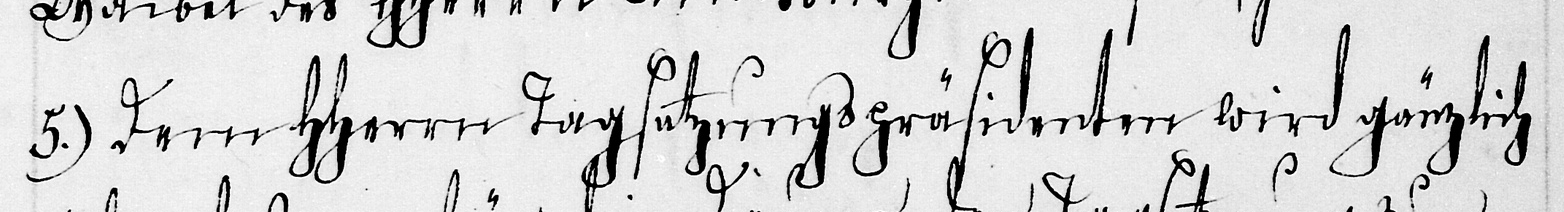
5.) Dem HHerrn Tagsatzungspräsidenten wird gänzlich
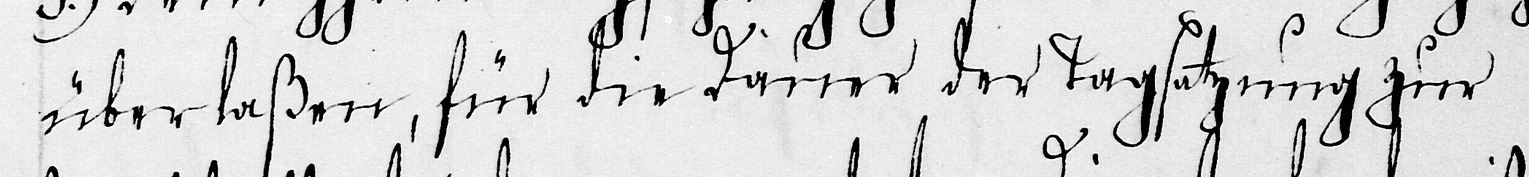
überlaßen, für die Dauer der Tagsatzung zur
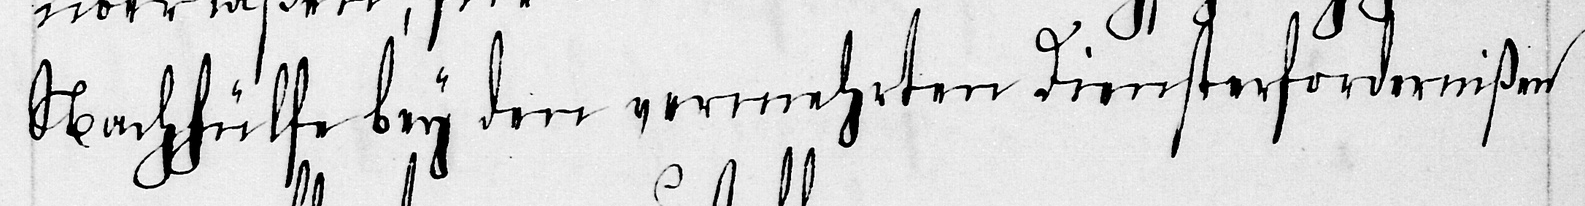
Nachhülfe bey den vermehrten Diensterfordernißen
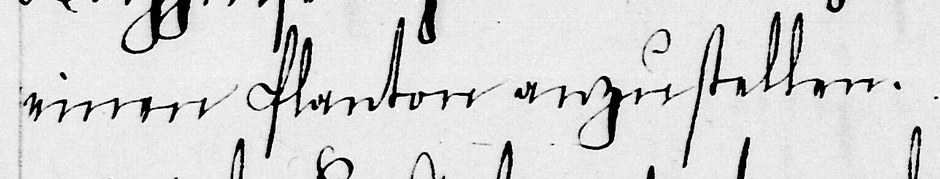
einen Planton anzustellen.
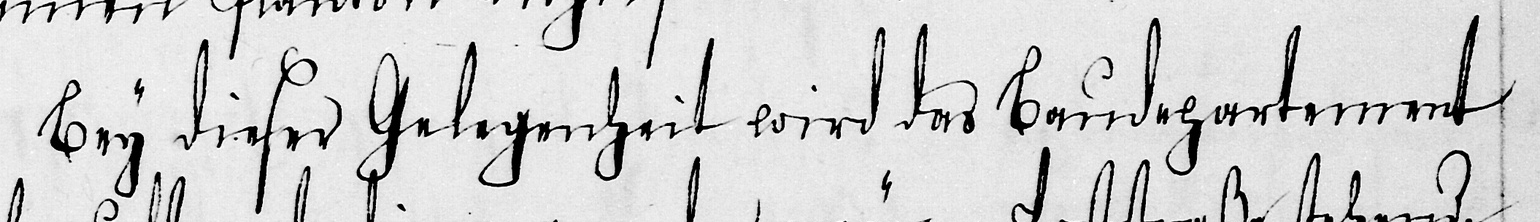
Bey dieser Gelegenheit wird das Baudepartement
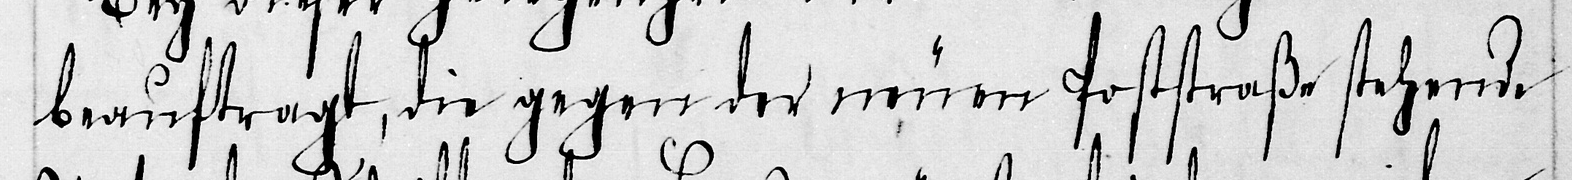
beauftragt, die gegen der neuen Poststraße stehende
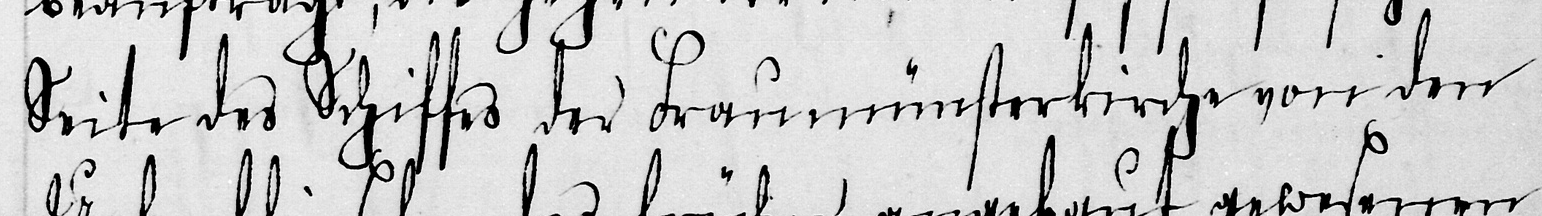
Seite des Schiffes der Fraumünsterkirche von den
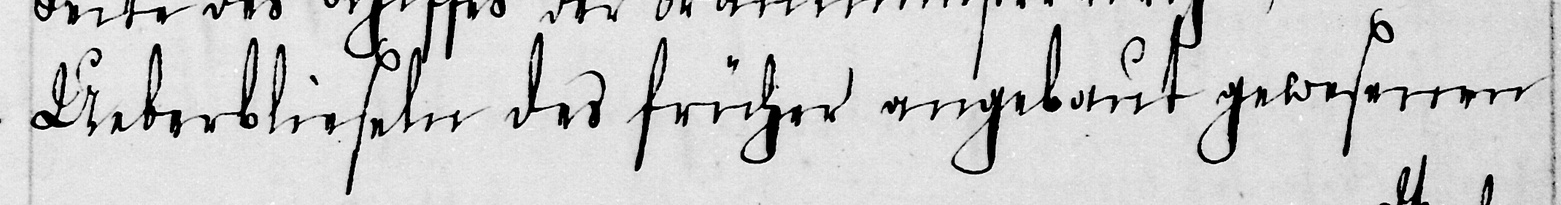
Ueberblieseln des früher angebaut gewesenen
